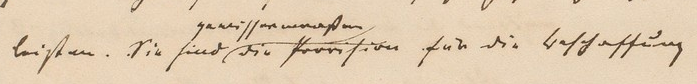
leisten. Sie sind gewissermaßen die Provision für die Beschaffung
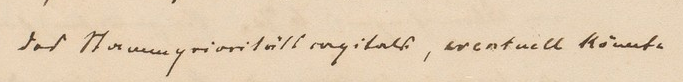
des Stammprioritätscapitals, eventuell könnte
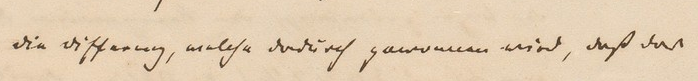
die Differenz, welche dadurch gewonnen wird, daß das
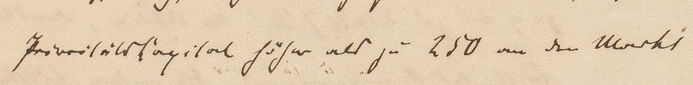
PrioritätsCaptial höher als zu 250 an den Markt
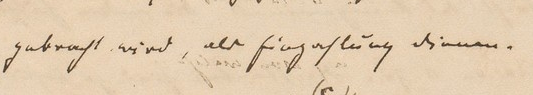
gebracht wird, als Einzahlung dienen.
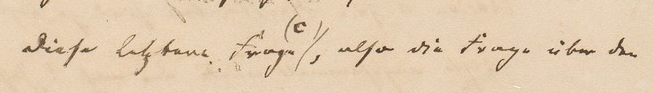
Diese letztere Frage (c), also die Frage über den
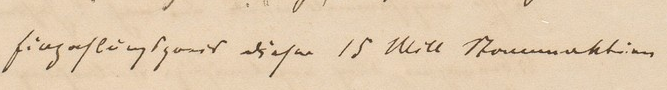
Einzahlungsspreis dieser 15 Mill Stammaktien
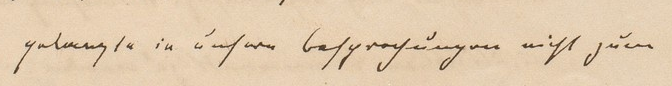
gelangte in unseren Besprechungen nicht zum
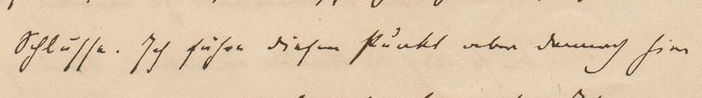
Schlusse. Ich führe diesen Punkt aber dennoch hier
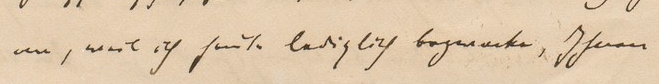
an, weil ich heute lediglich bezwecke, Ihnen
